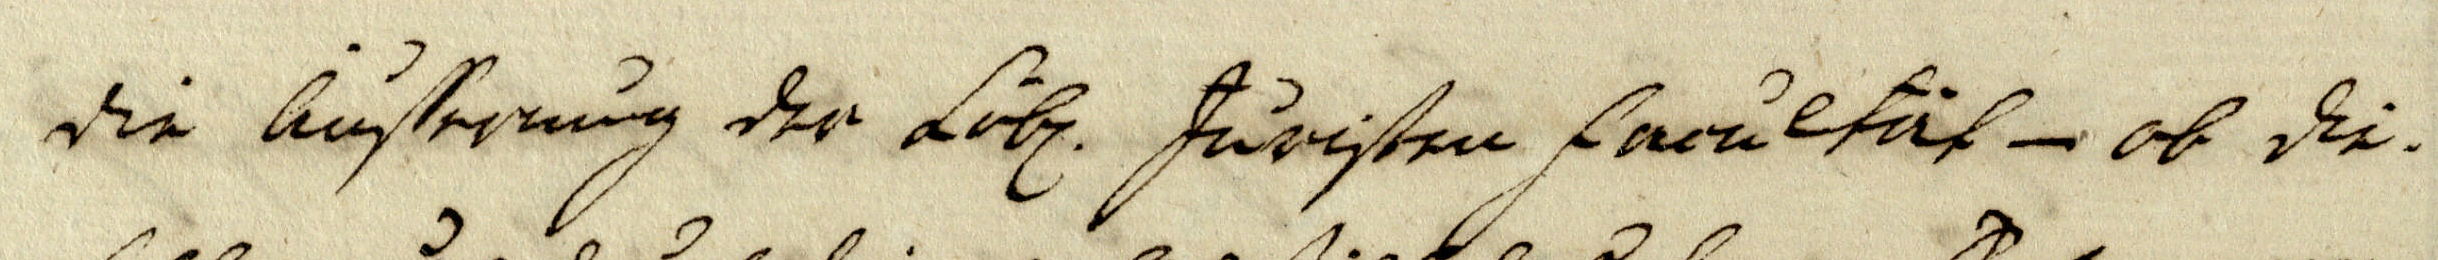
die Äusserung der Löbl. Juristen Facultät ob die¬
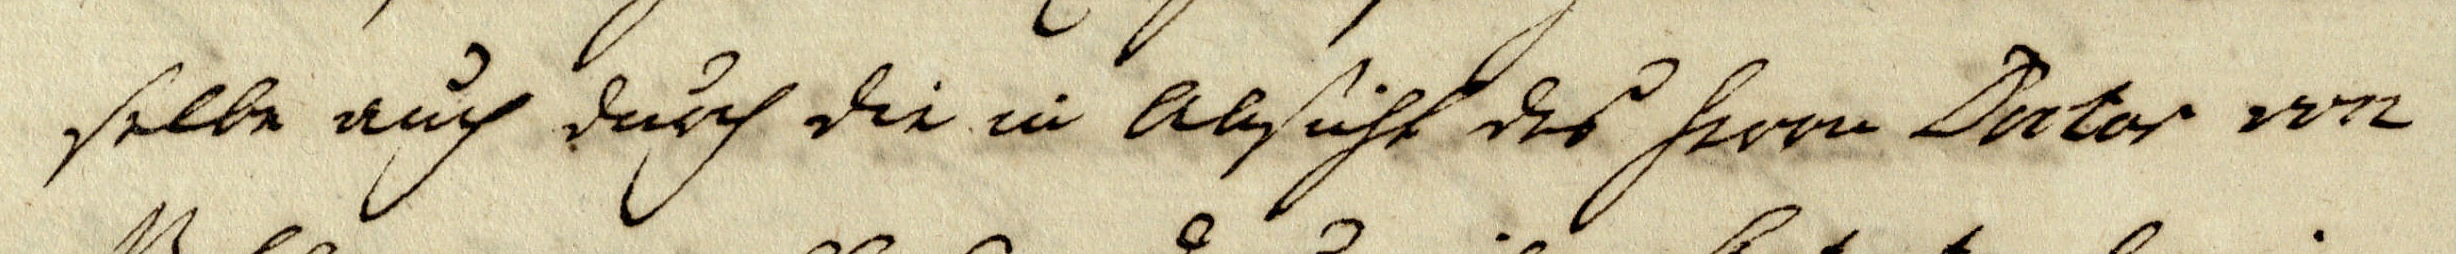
selbe auch durch die in Absicht des Herrn Doctor von
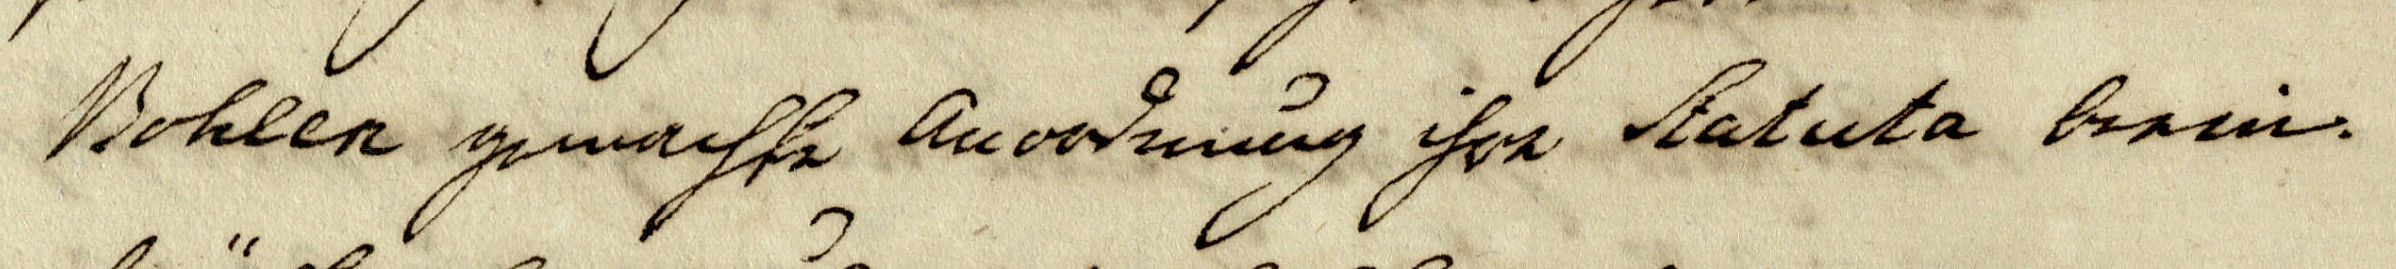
Bohlen gemachte Anordnung ihre Statuta beein¬
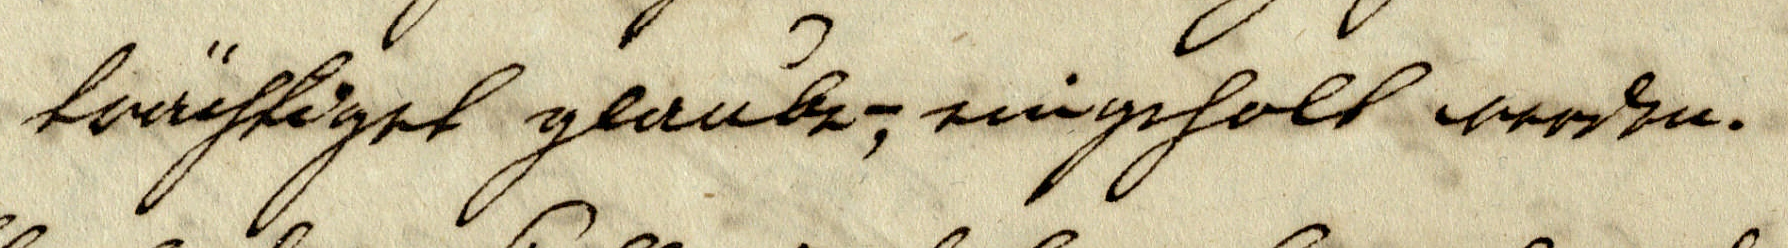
trächtiget glaube, eingeholt werden.
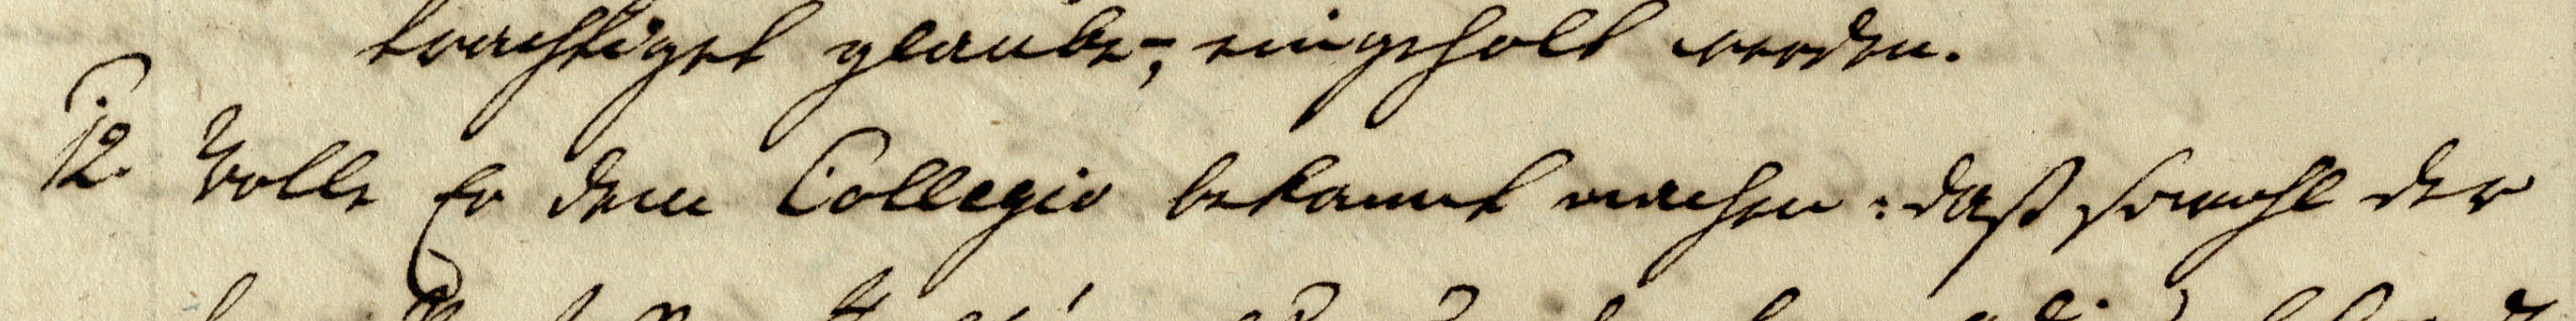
12. Wolle Er dem Collegio bekannt machen daß sowohl der
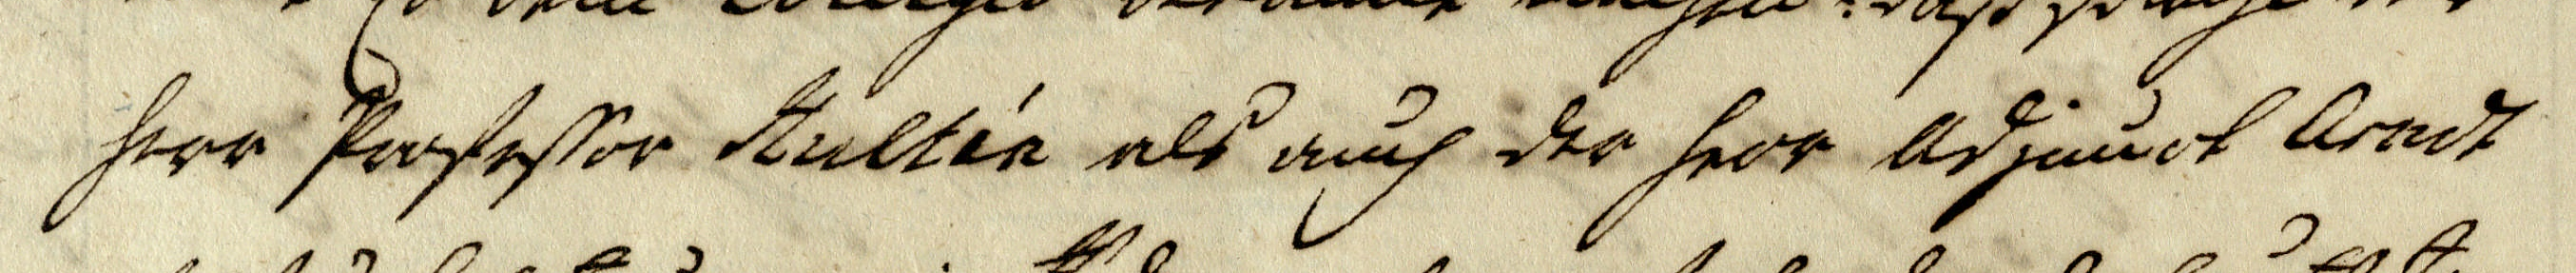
Herr Professor Hultén als auch der Herr Adjunct Arndt
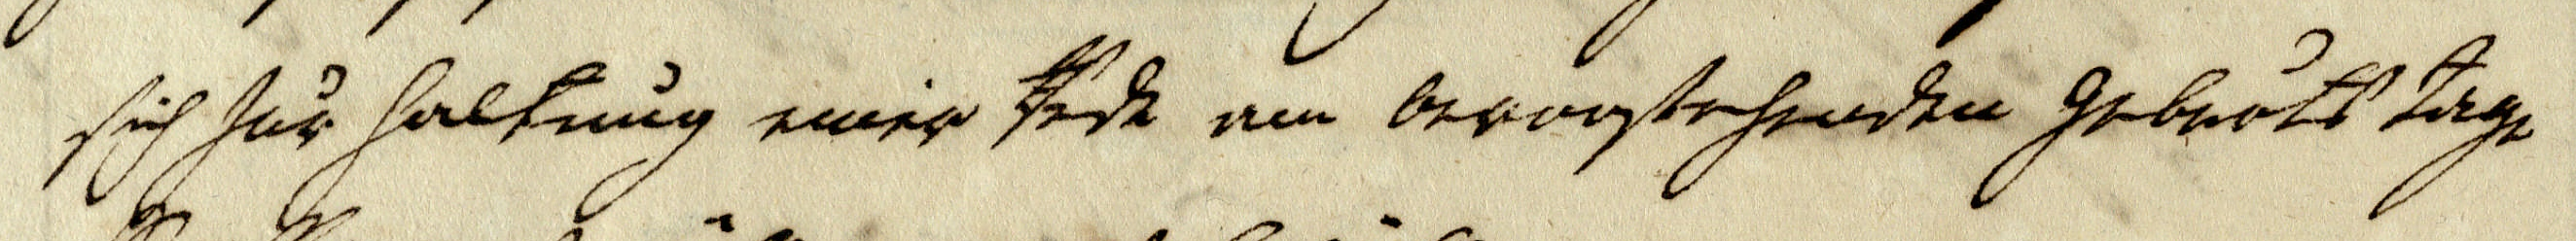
sich zur Haltung einer Rede am bevorstehenden Geburts Tage
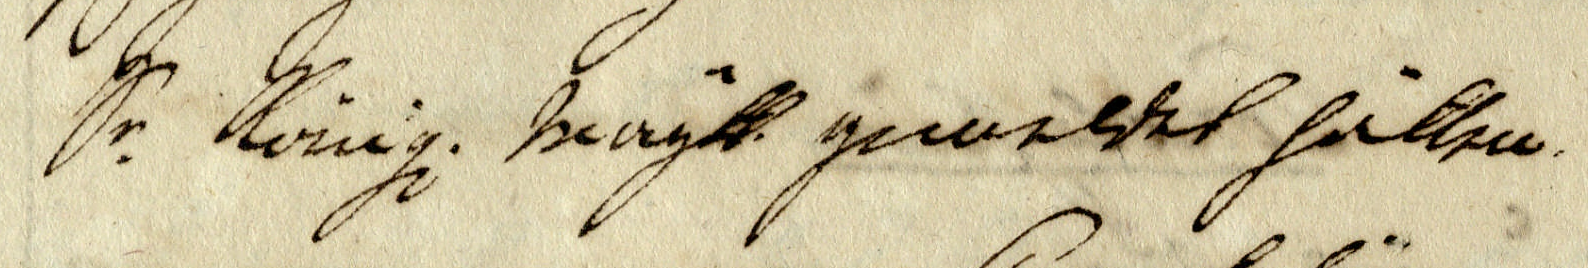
Sr. Königl. Maÿtt. gemeldet hätten.
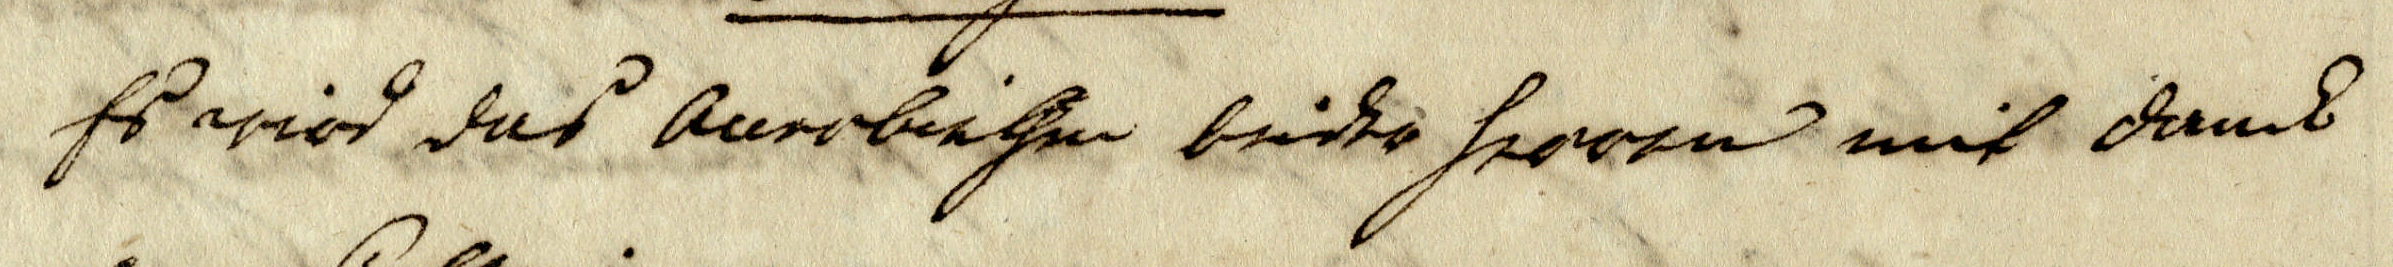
Es wird das Anerbiethen beider Herren mit Danck
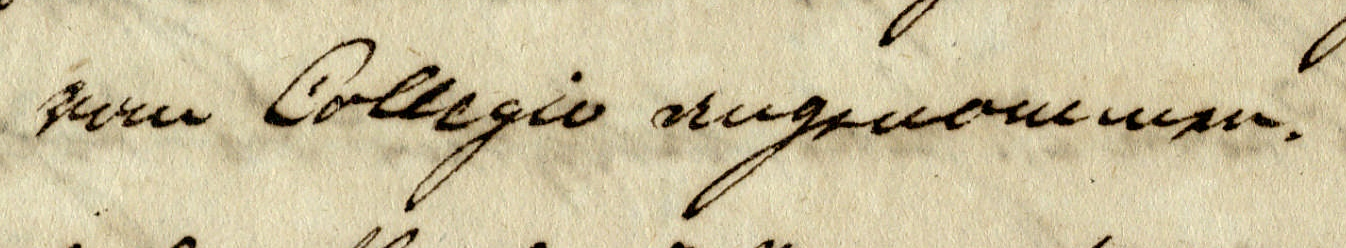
vom Collegio angenommen.
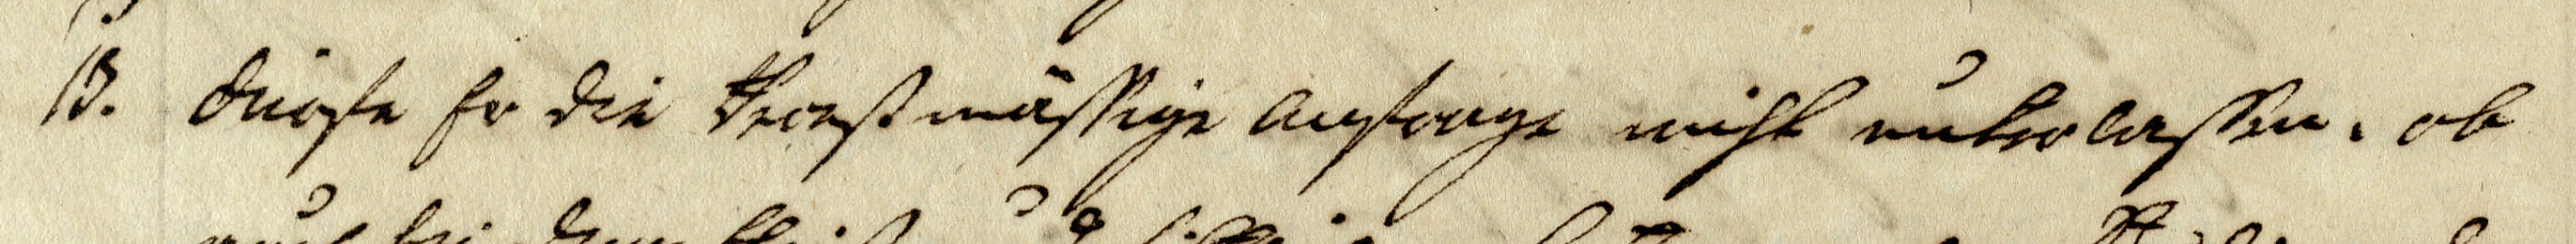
13. Dürfe Er die Receßmässige Anfrage nicht unterlassen: ob
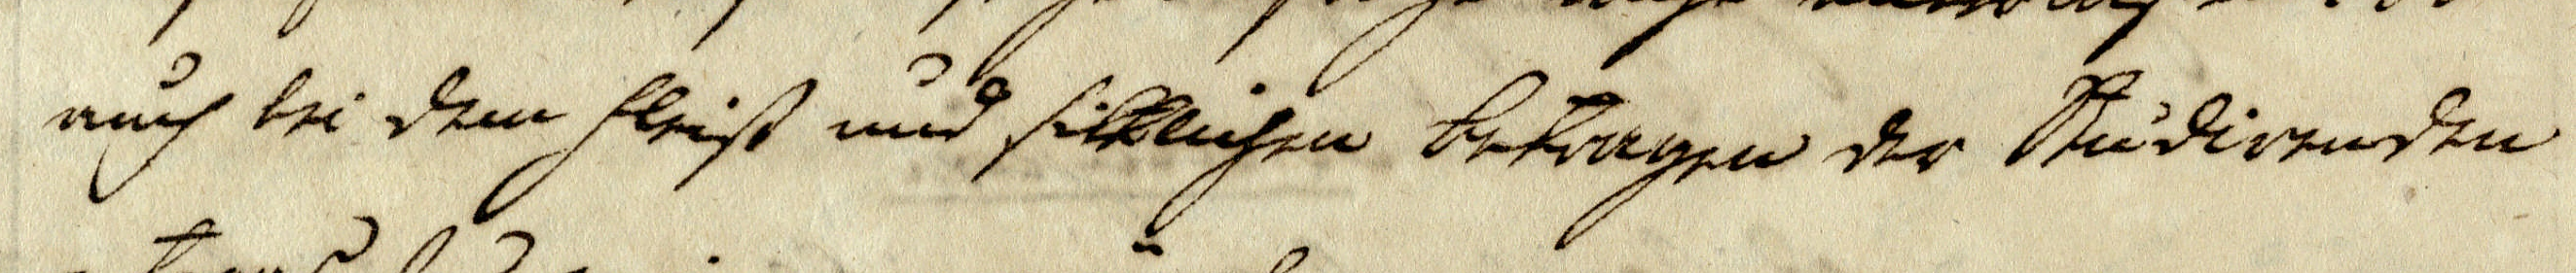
auch bei dem Fleiß und sittlichen Betragen der Studirenden
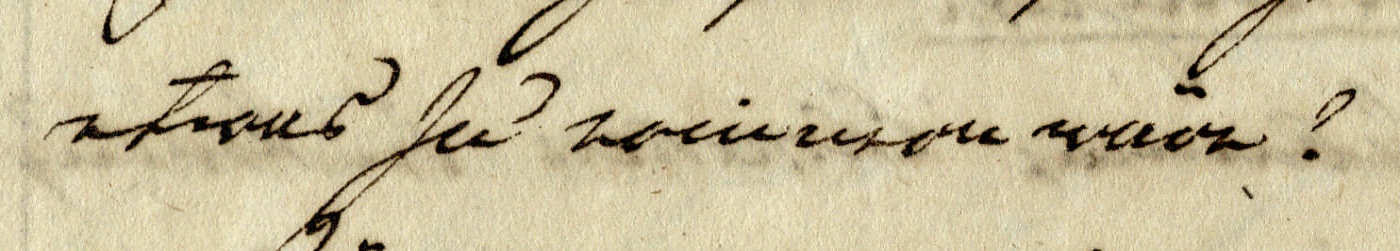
etwas zu erinnern wäre?
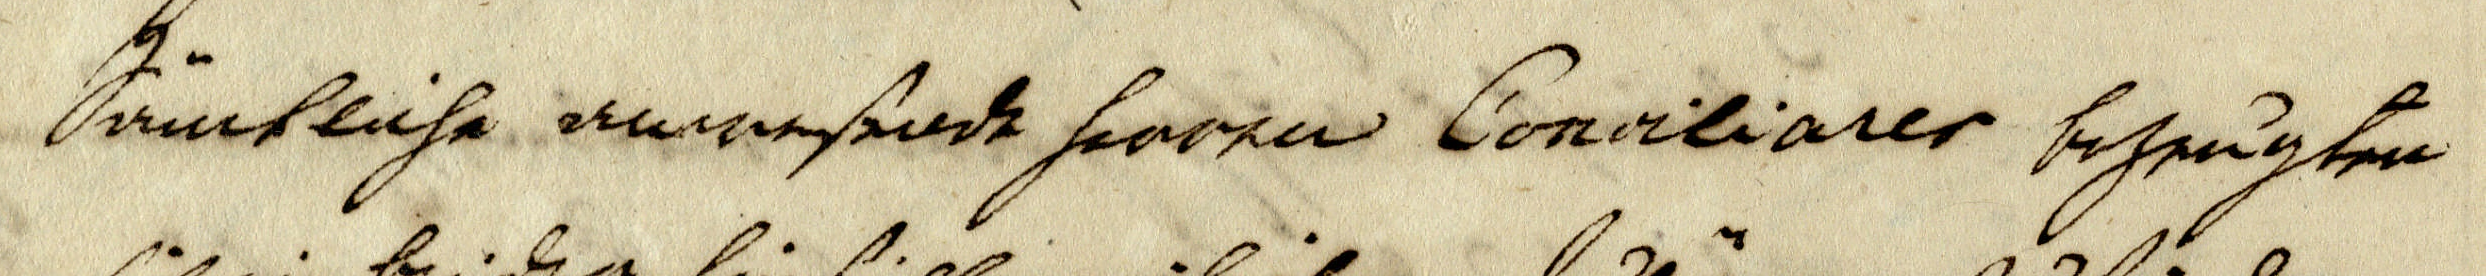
Sämtliche anwesende Herren Conciliares bezeugten
